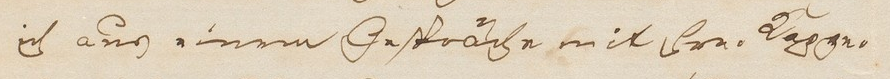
ich aus einem Gespräche mit Hrn. Kappe-
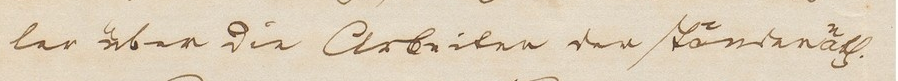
ler über die Arbeiten der ständeräth-
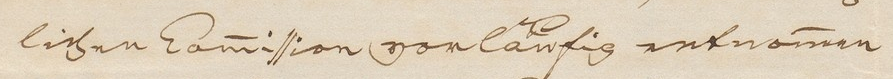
lichen Comission vorläufig entnommen
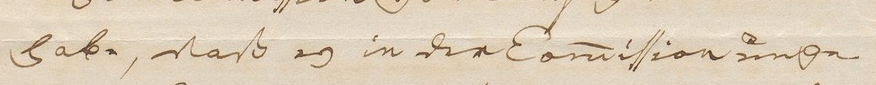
habe, daß es in der Commission unge-
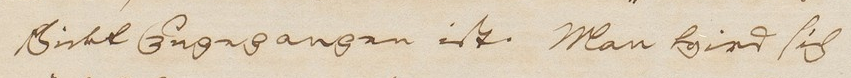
schickt zugegangen ist. Man wird sich
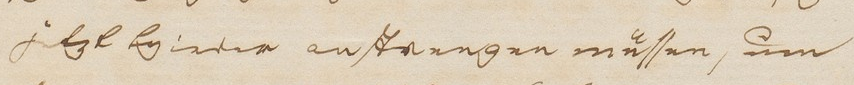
jetzt wieder anstrengen müssen, um
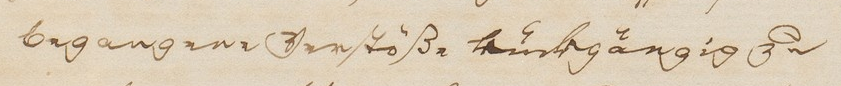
begangene Verstöße rückgängig zu
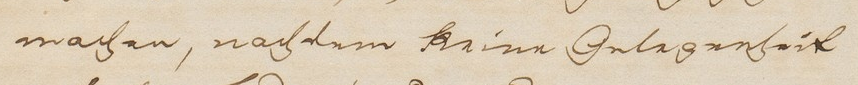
machen, nachdem keine Gelegenheit
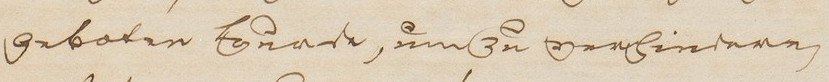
geboten wurde, um zu verhindern,
